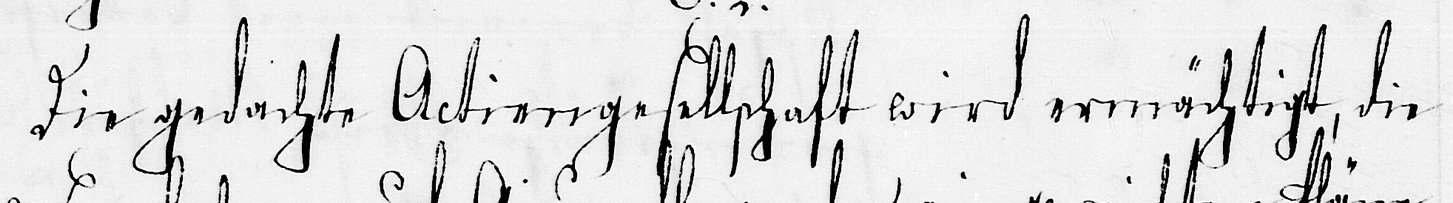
Die gedachte Actiengesellschaft wird ermächtigt, die
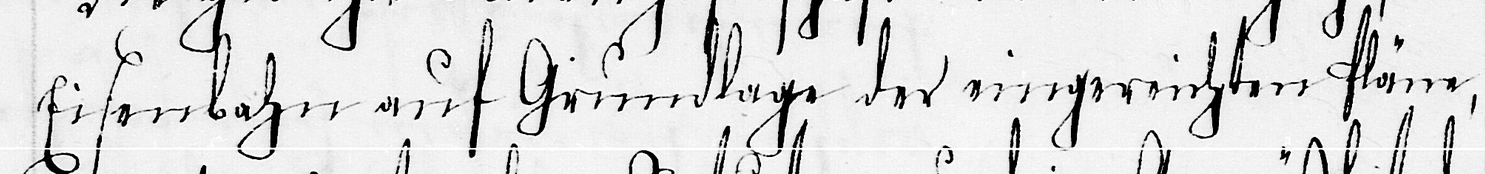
Eisenbahn auf Grundlage der eingereichten Pläne,
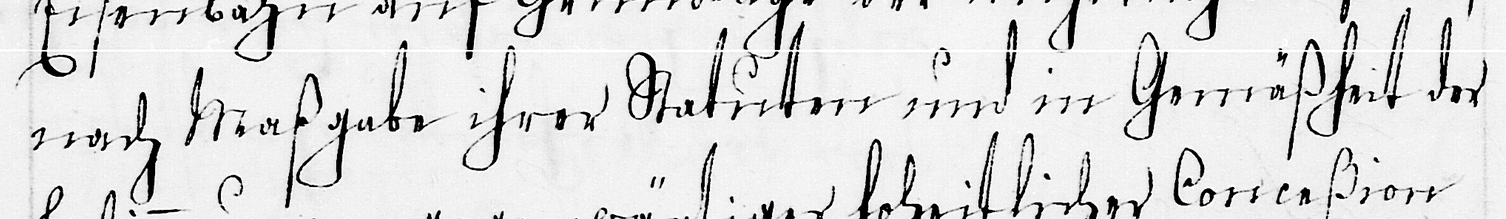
nach Maßgabe ihrer Statuten und in Gemäßheit der
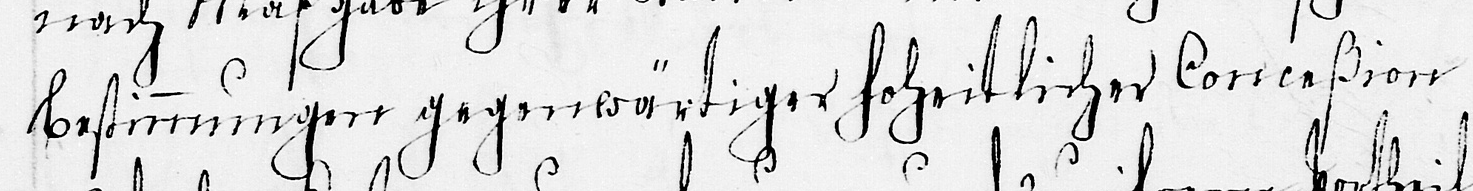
Bestimmungen gegenwärtiger hoheitlicher Conceßion
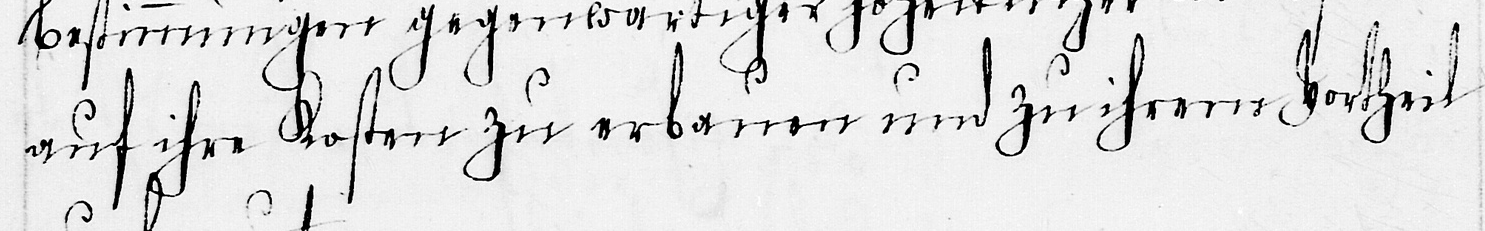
auf ihre Kosten zu erbauen und zu ihrem Vortheil
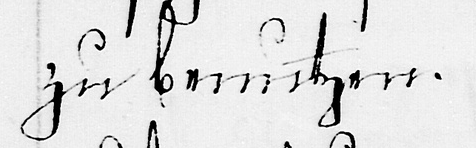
zu benutzen.
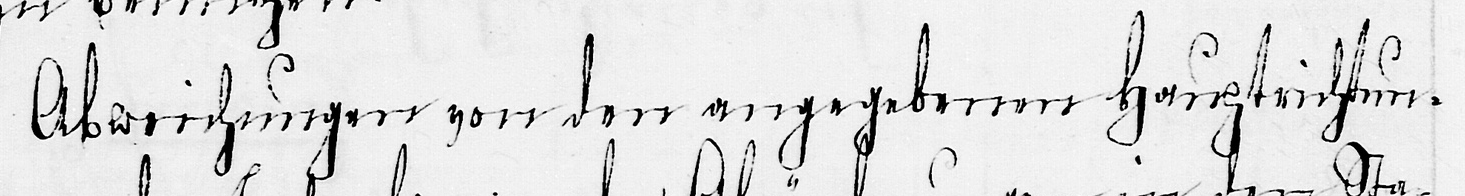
Abweichungen von den angegebenen Hauptrichtun¬
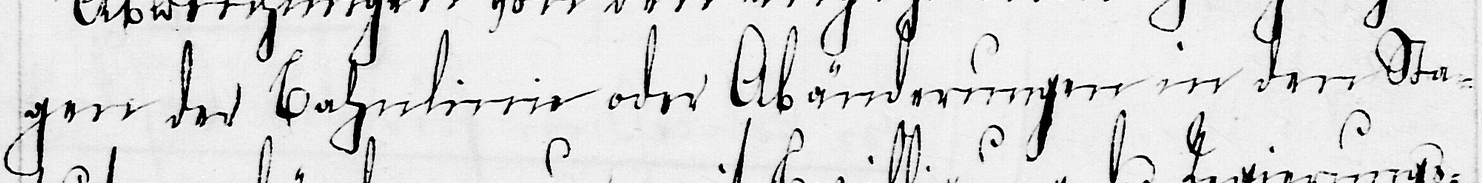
gen der Bahnlinie oder Abänderungen in den Sta¬
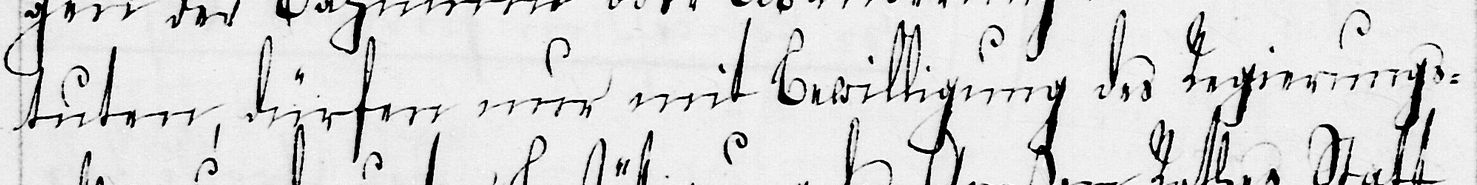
tuten, dürfen nur mit Bewilligung des Regierungs¬
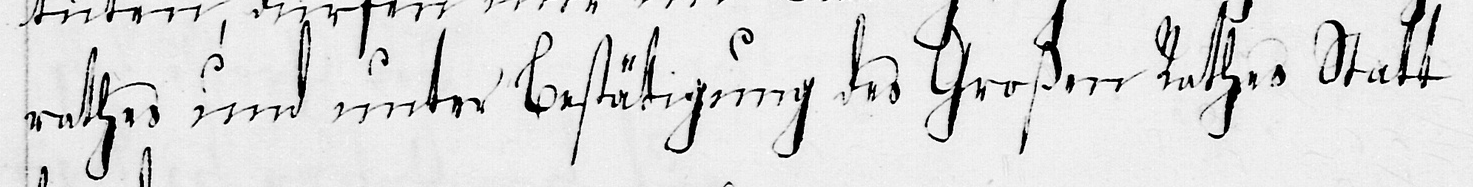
rathes und unter Bestätigung des Großen Rathes Statt
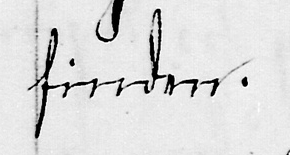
finden.
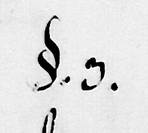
§. 3.
